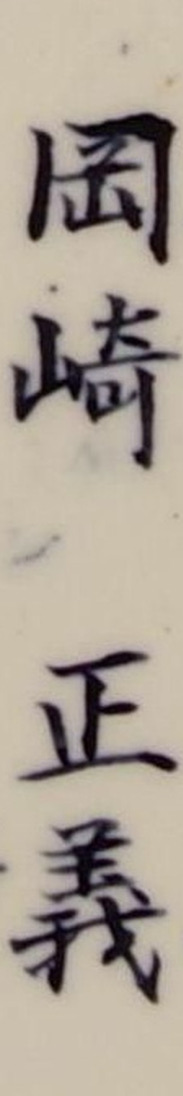岡崎正義
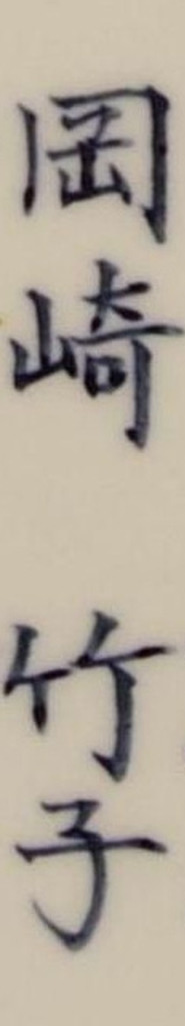岡崎竹子
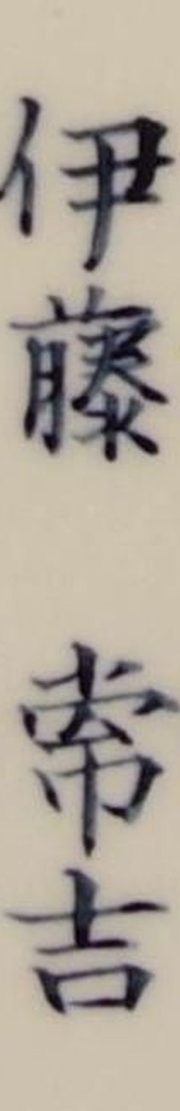伊藤常吉
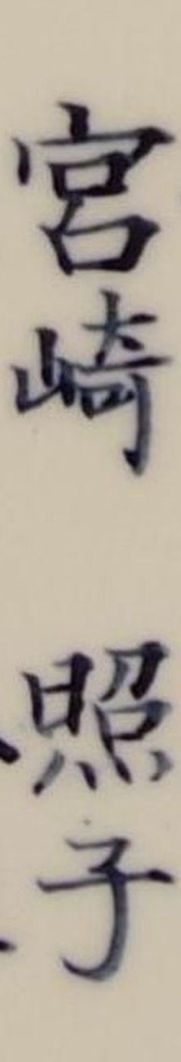宮崎照子
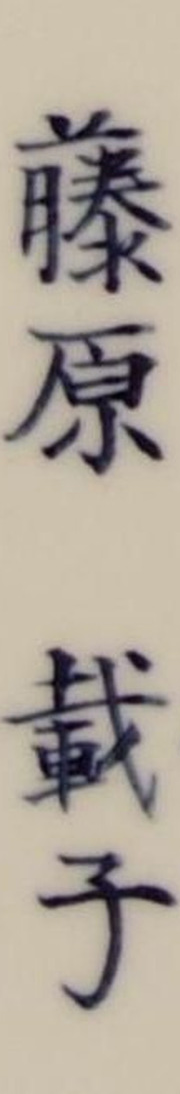藤原載子
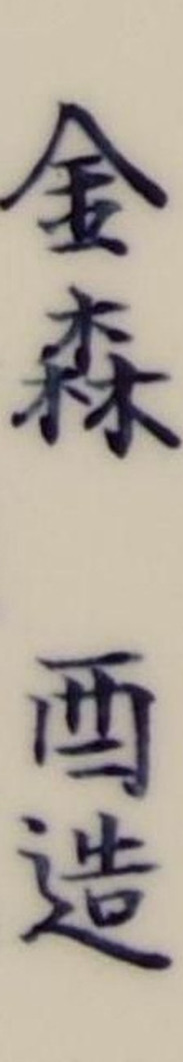金森西造
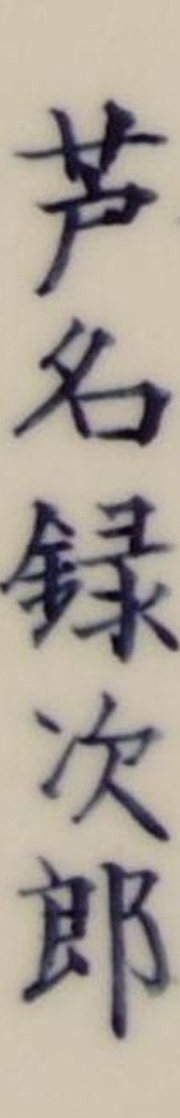芦名録次郎
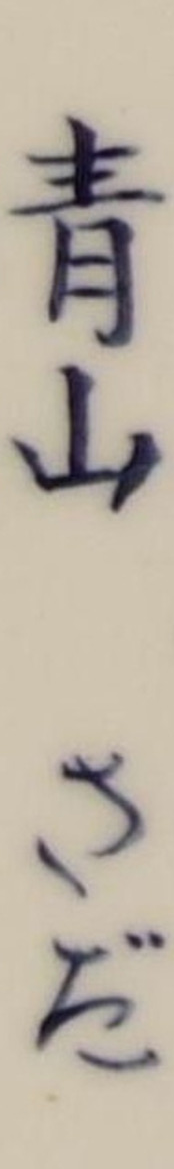青山さだ

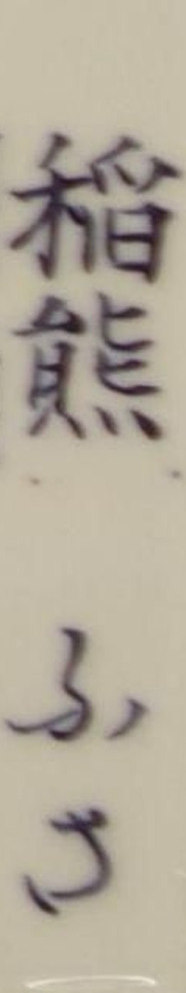稲熊ふさ
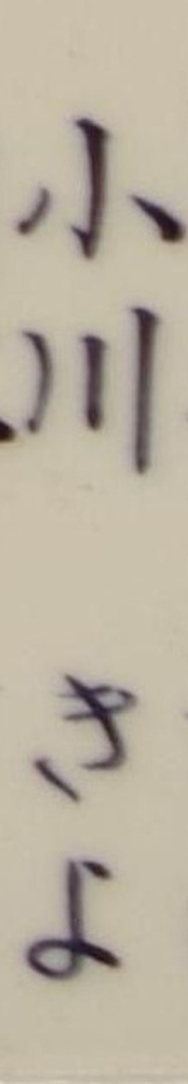小川きよ
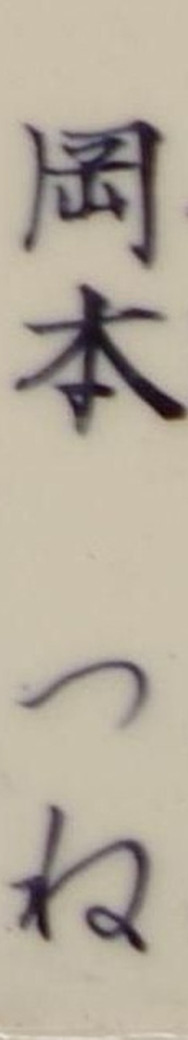岡本つね
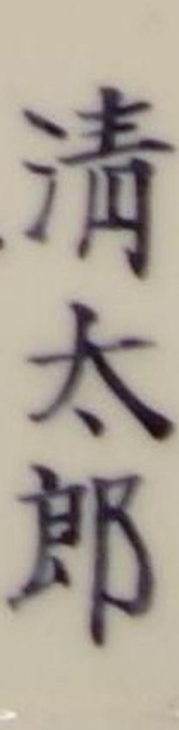清太郎
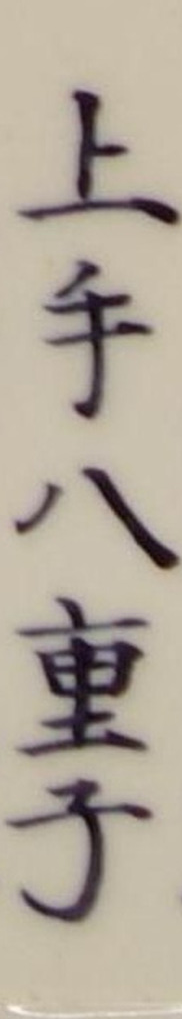上手八重子
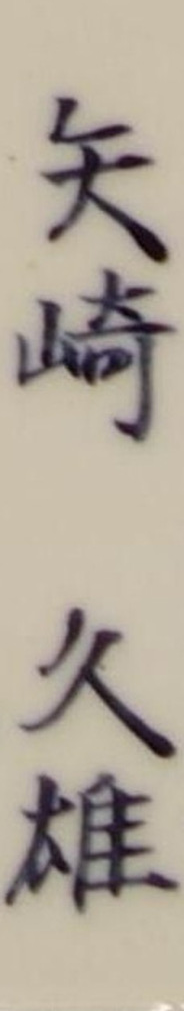矢崎久雄
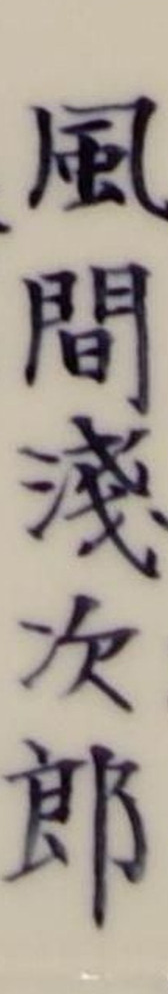風間浅次郎
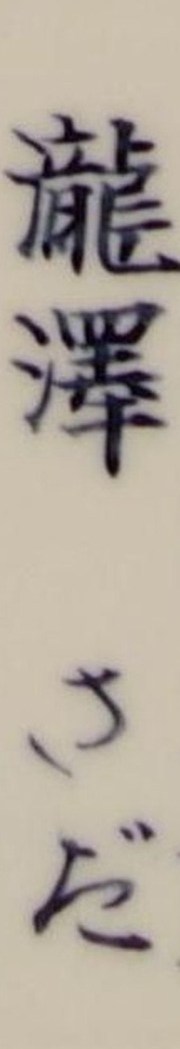瀧澤さだ
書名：M~S
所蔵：高野山金剛峯寺
